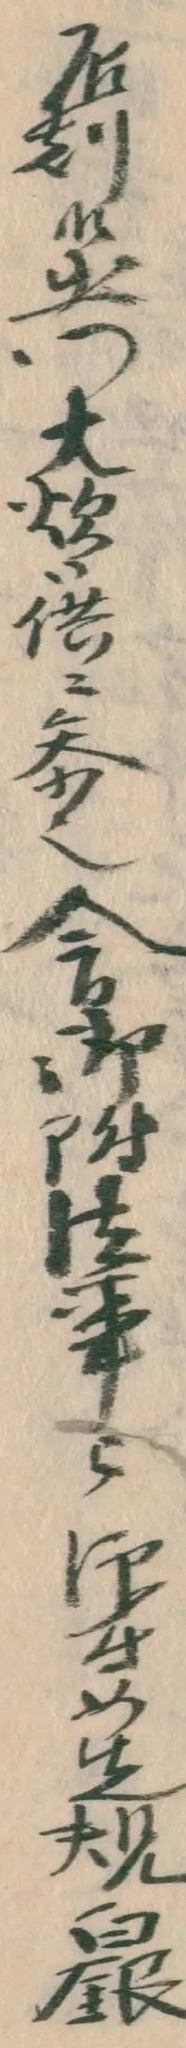辰刻御出門大炊御供ニ参也今日御附法事被仰付如先規白銀
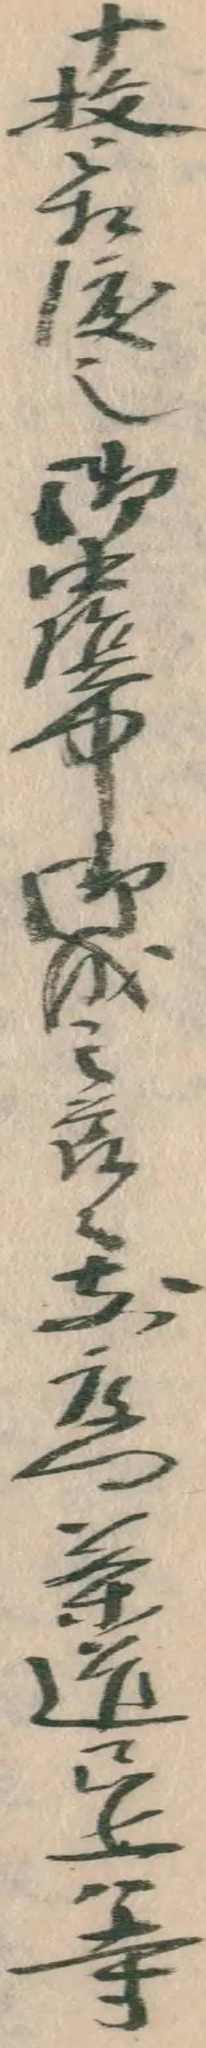十枚被相渡也御中陰中御成之節之支度向茶道已上は寺
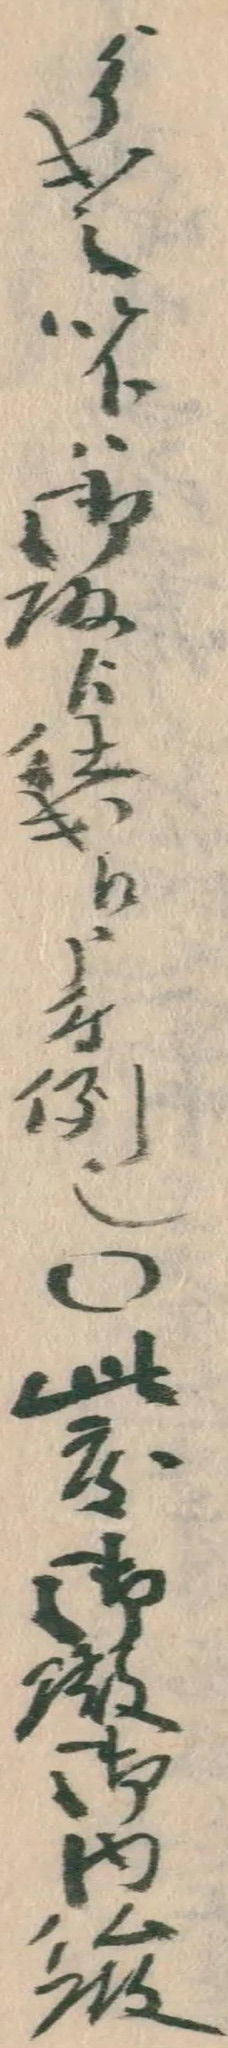より出之以下ハ御殿ゟ仕出江申付例也○此度御殿御内仏殿
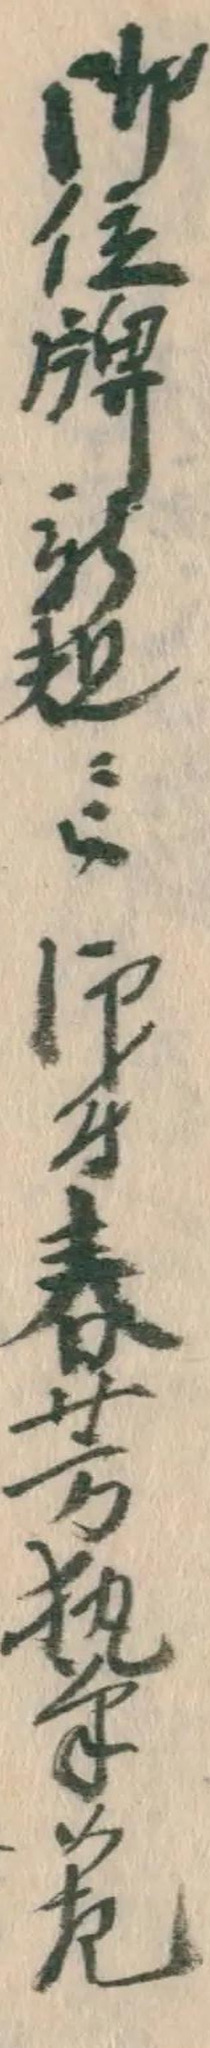御位牌新規ニ被仰付春芳執筆如左
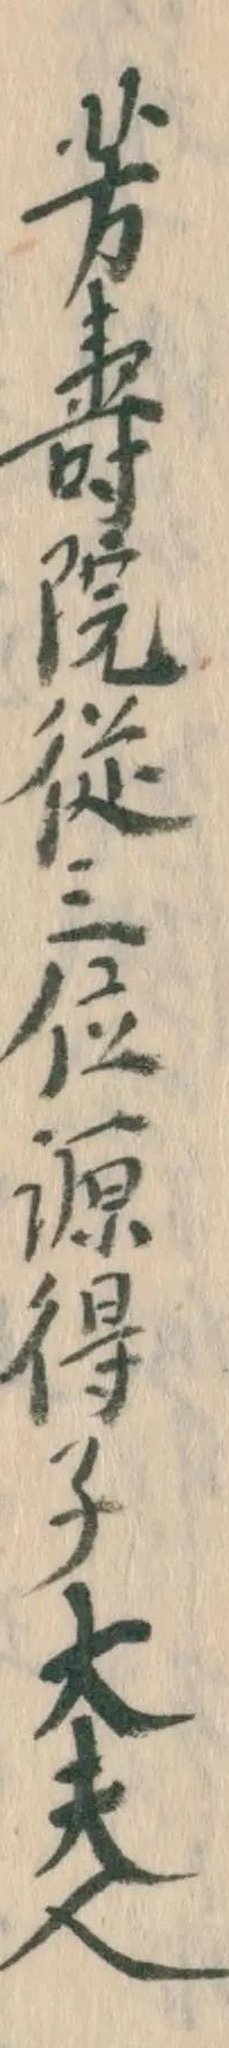芳壽院従三位源得子大夫人
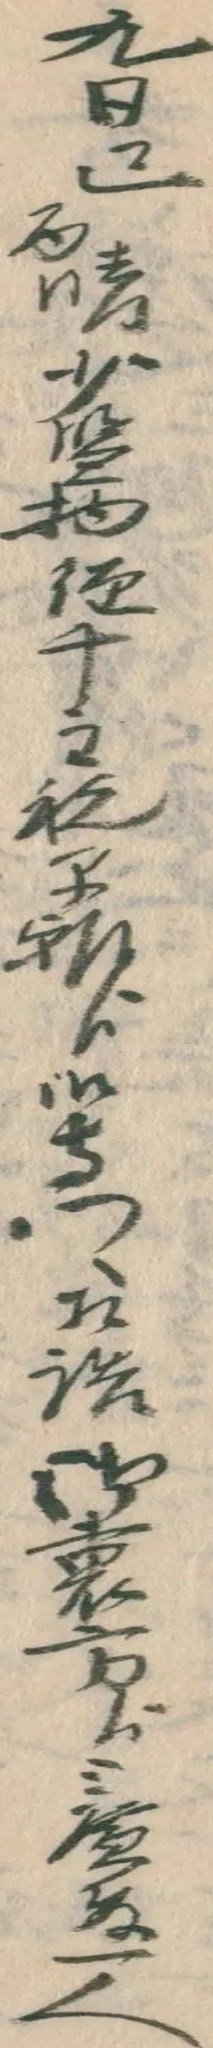九日己酉晴少監物経千主税早朝ゟ御寺門へ相詰御裏方ゟ御広敷一人
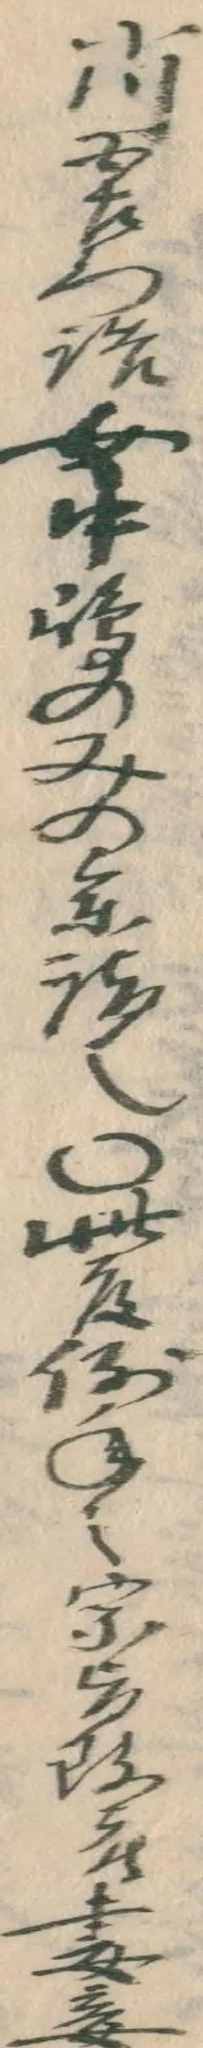小川五左衛門詰女中嶋のみの参詣也○此度例年之宗旨改ニ付妻妾
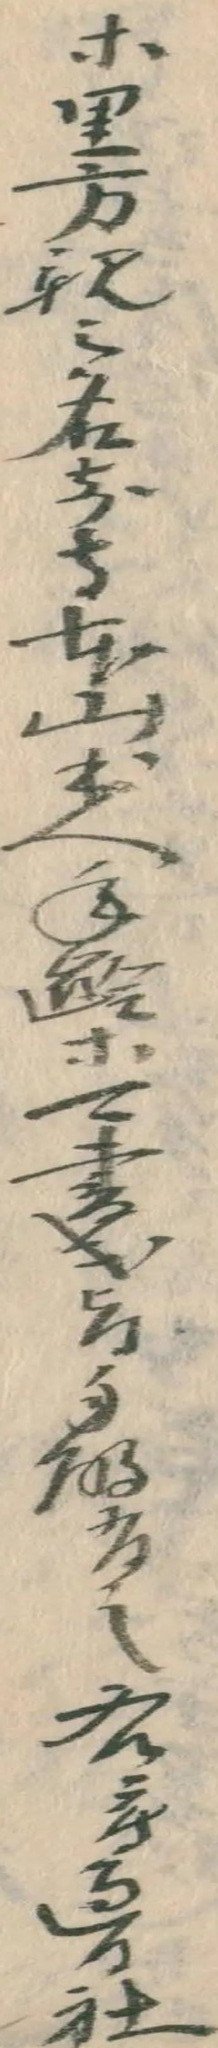等里方親之名前寺本山本人年齢等可書出旨手觸有之右ニ付過日社
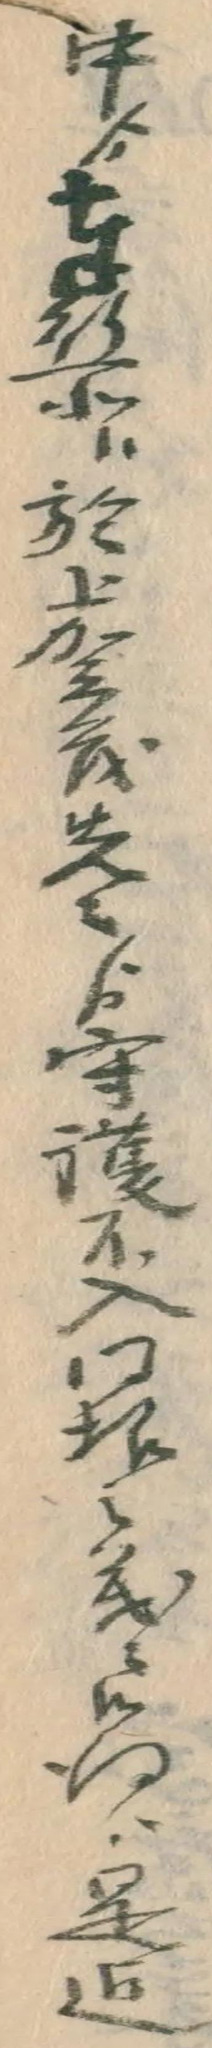中ゟ奉行所え於上賀茂先々ゟ守護不入同様之義に候得ハ是迄

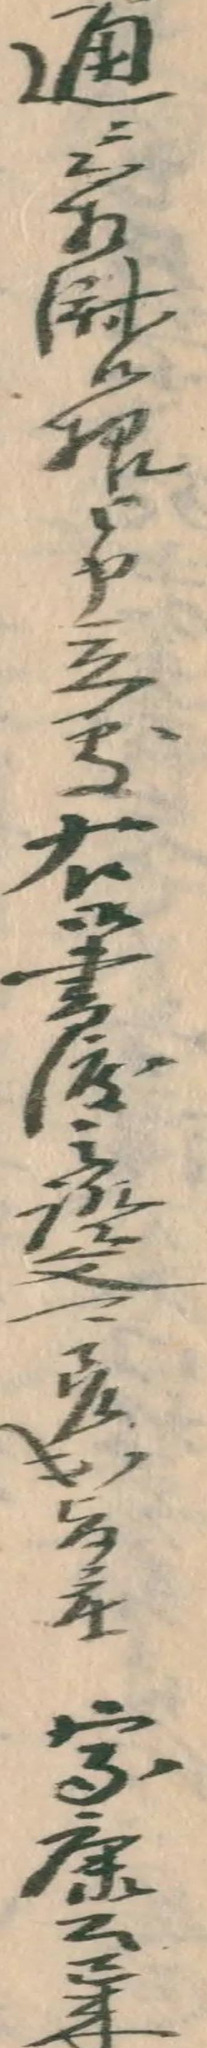通ニ而相済候様被申立處右御書渡之證文可差出旨ニ付家康公已来
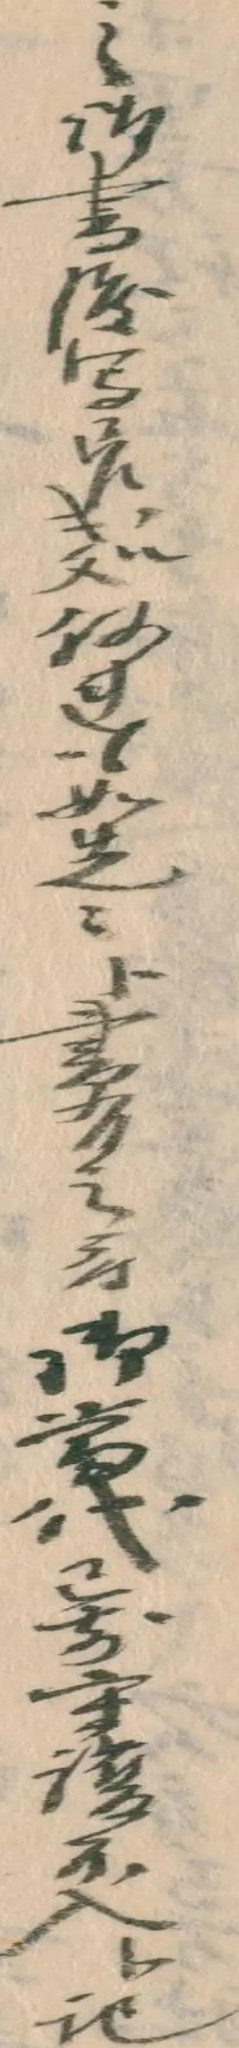之御書渡写差出処何れも如先々ト書有之ニ付御當代已前守護不入ト記
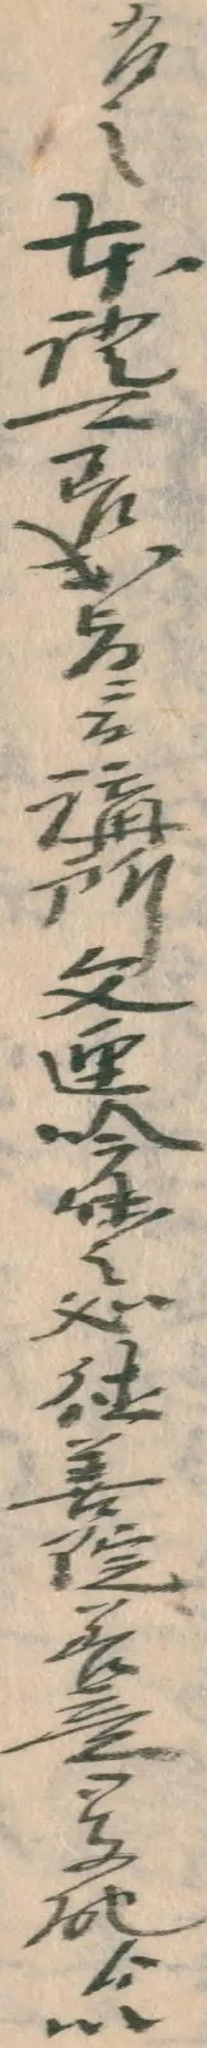有之本證可差出旨ニ而講所文匣吟味之処徳善院善意御支配ゟ以
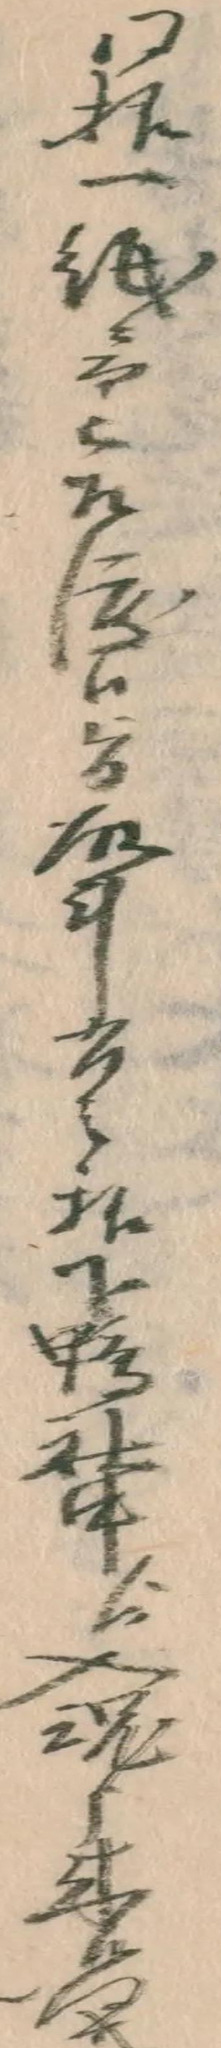同様一紙ニ而被召渡候旨取斗有之候様下鴨社中ゟ入魂申来候得共
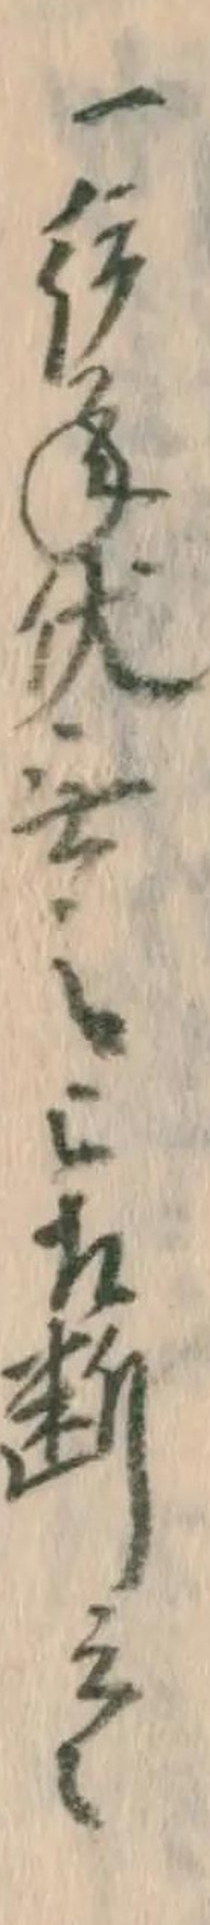一統承伏無之被相断云々
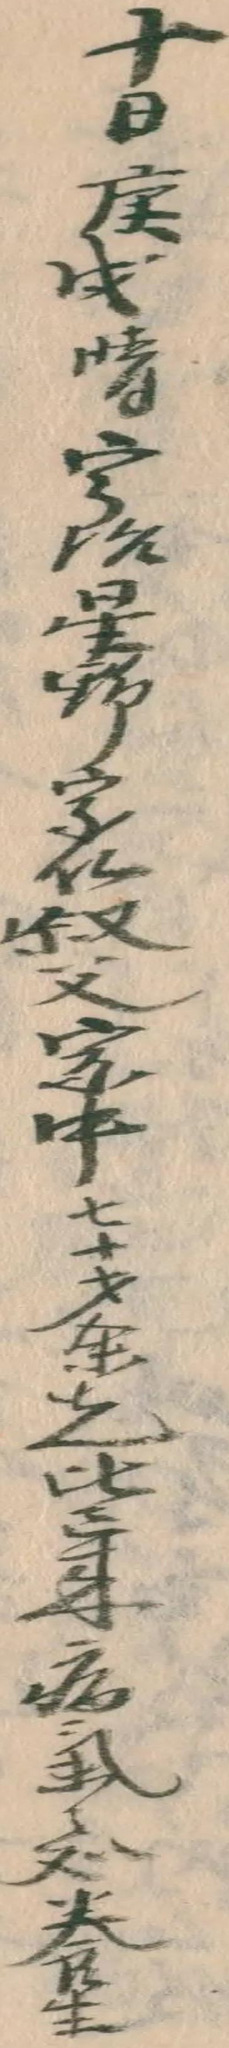十日庚戌晴宇治星野家仏叔父宗中七十才余先比已来病気之処養生
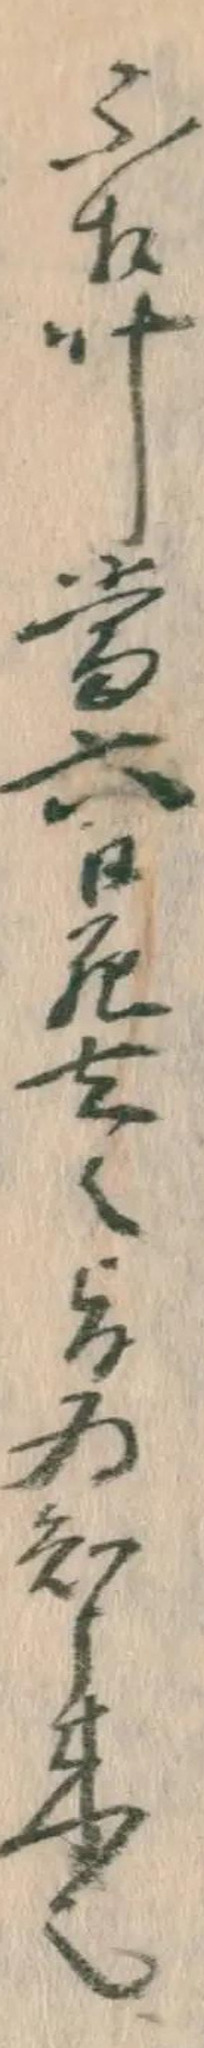不相叶當六日死去之旨為知申来也
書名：賀茂社記録. 第69冊
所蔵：国立国会図書館 National Diet Library, JAPAN
